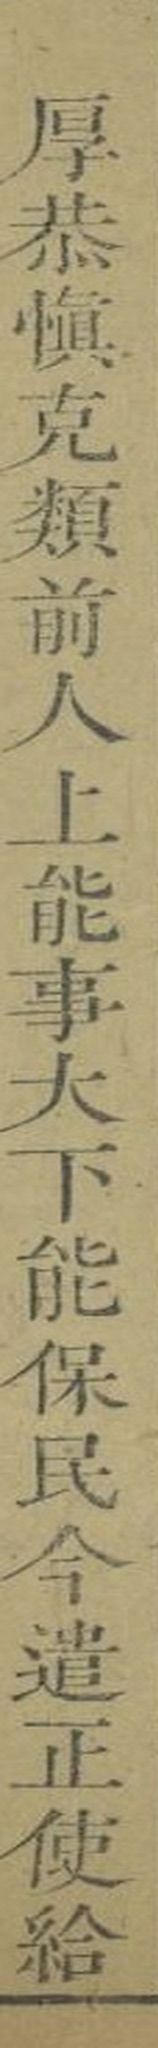厚恭慎克類前人上能事大下能保民今遣正使給
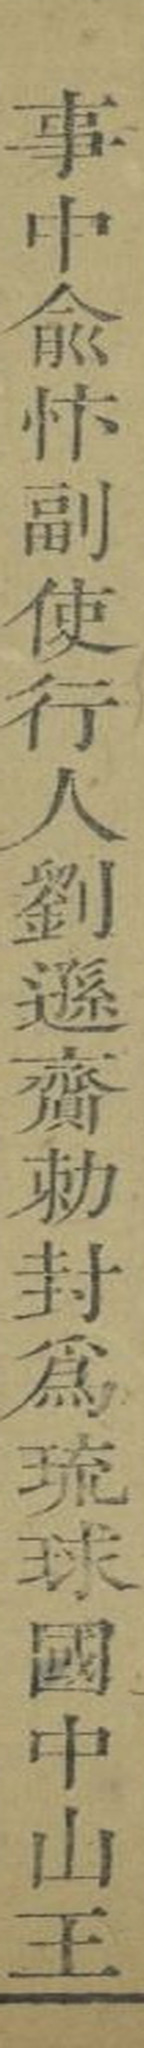事中兪忭副使行人劉遜齎勅封為琉球国中山王
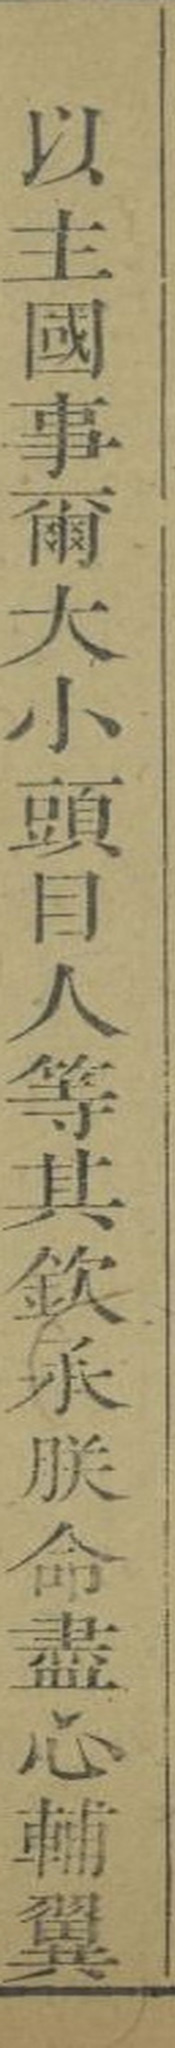以主国事爾大小頭目人等其欽承朕命尽心輔翼
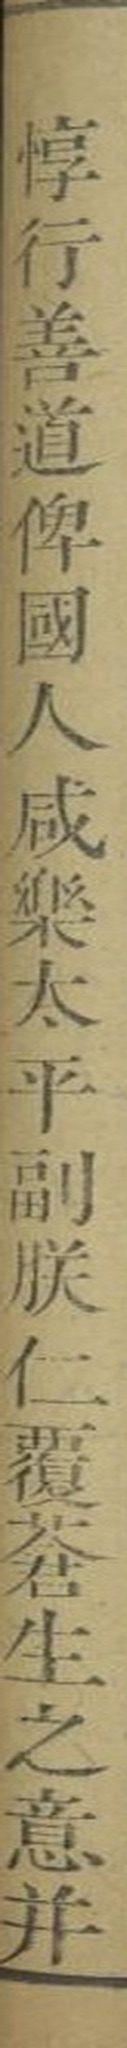惇行善道俾国人咸楽太平副朕仁覆蒼生之意并
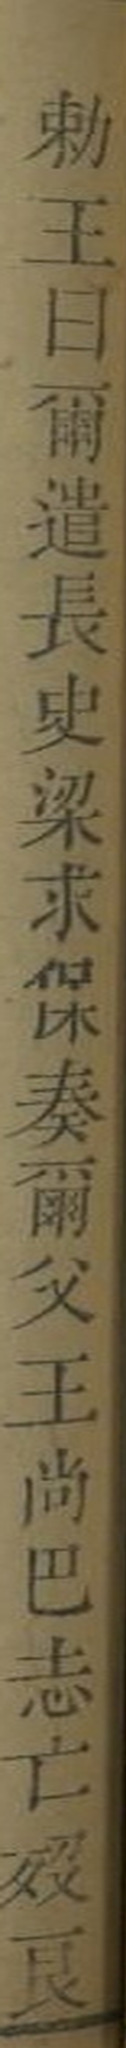勅王曰爾遣長史梁求保奏爾父王尚巴志亡歿良
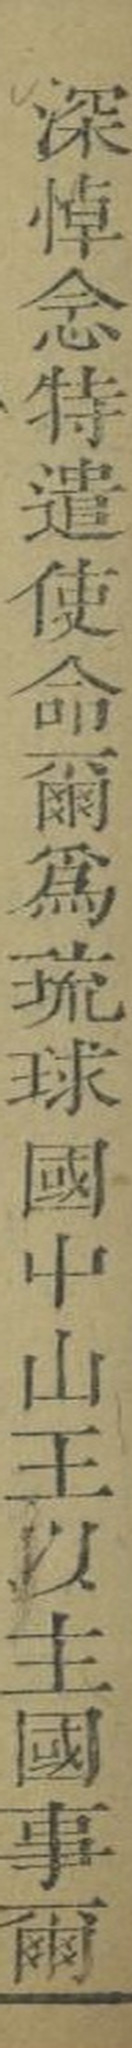深悼念特遣使命爾為琉球国中山王以主国事爾
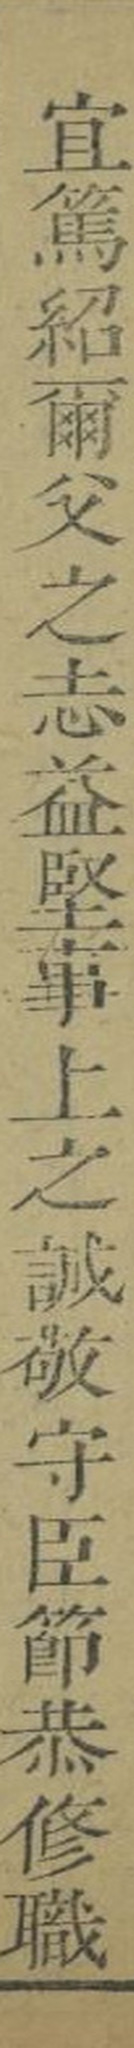宜篤紹爾父之志益堅事上之誠敬守臣節恭修職
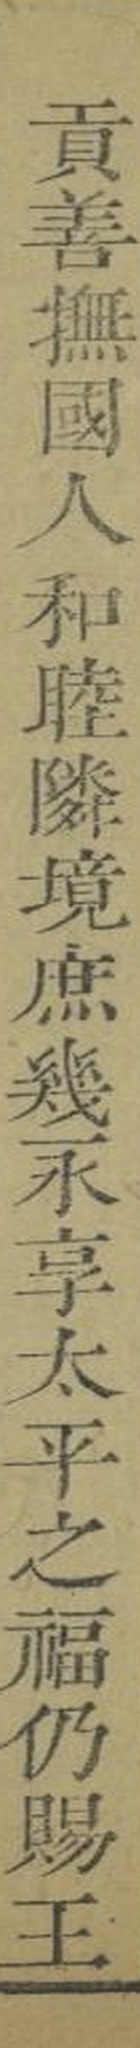貢善撫国人和睦隣境庶幾永享太平之福仍賜王
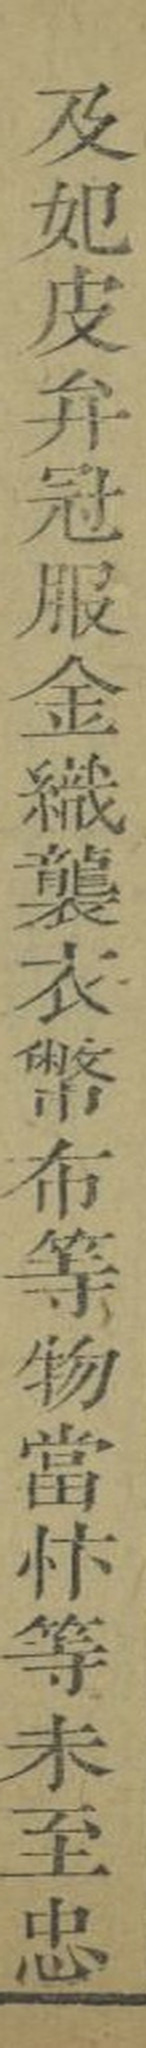及妃皮弁冠服金織襲衣幣布等物当忭等未至忠
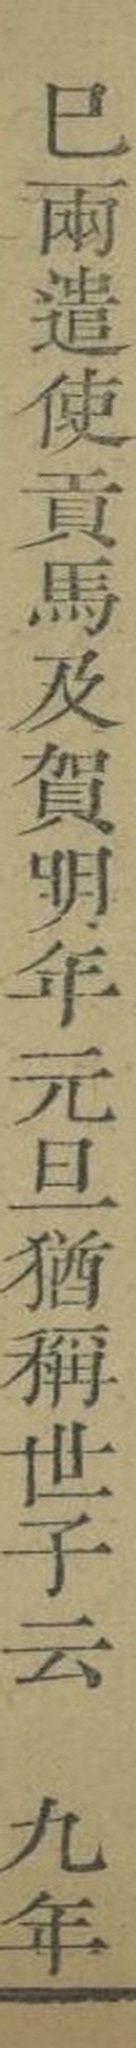巳両遣使貢馬及賀明年元旦猶称世子云九年
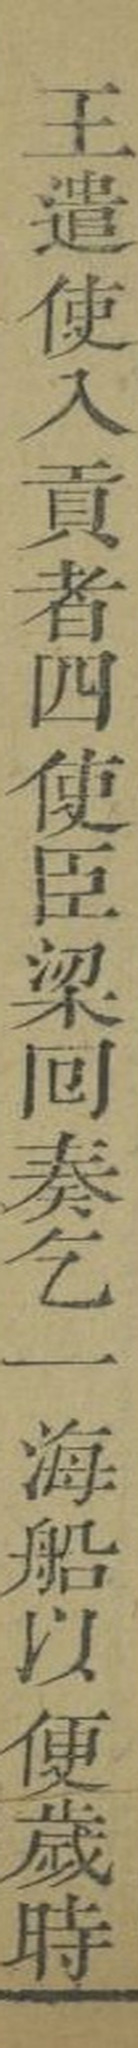王遣使入貢者四使臣梁回奏乞一海船以便歳時
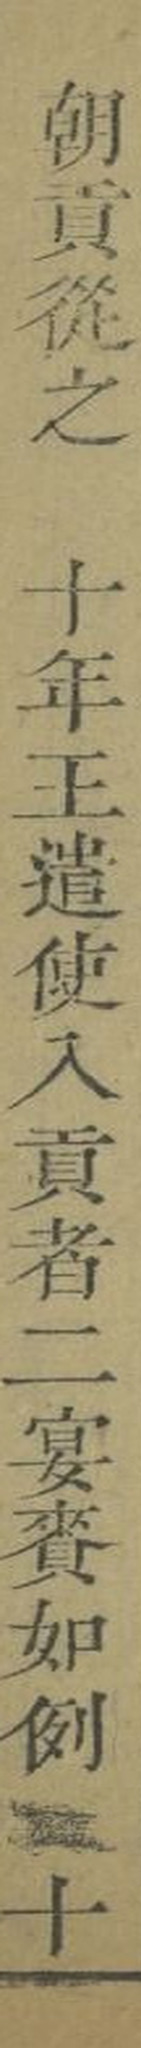朝貢従之十年王遣使入貢者二宴賚如例十
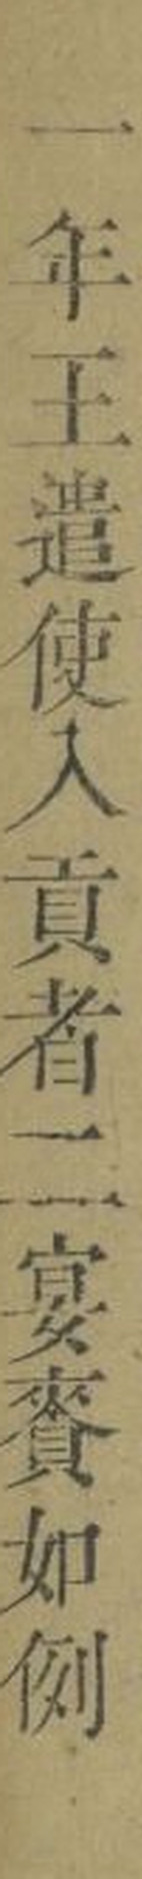一年王遣使入貢者二宴賚如例

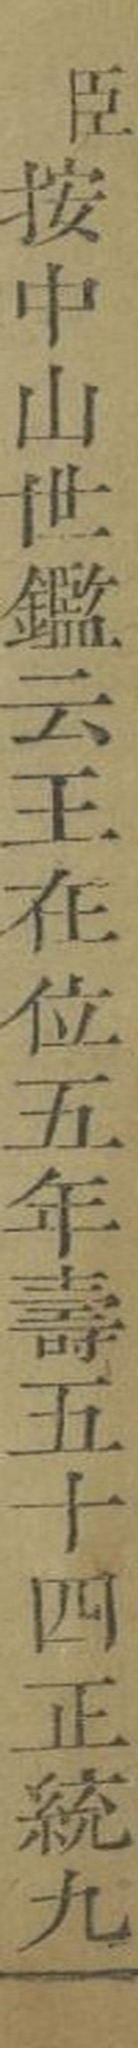臣按中山世鑑云王在位五年寿五十四正統九
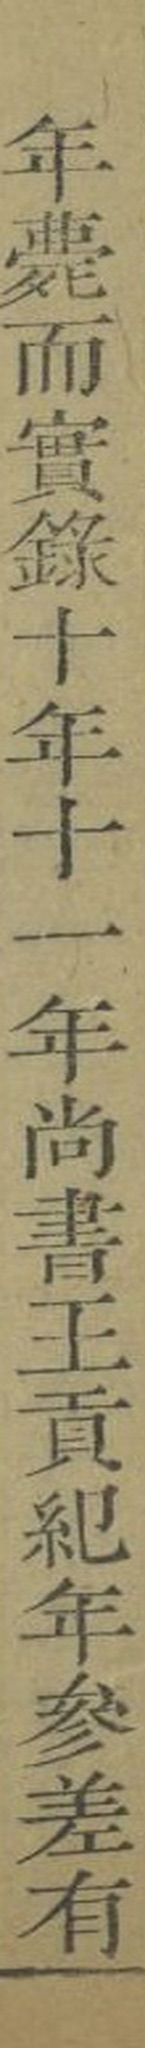年薨而実録十年十一年尚書王貢紀年参差有
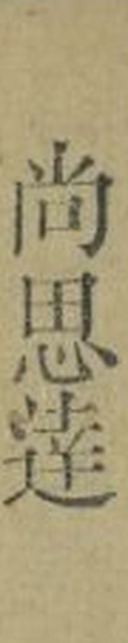尚思達
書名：中山伝信録 巻三
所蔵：University of the Ryukyus Library
